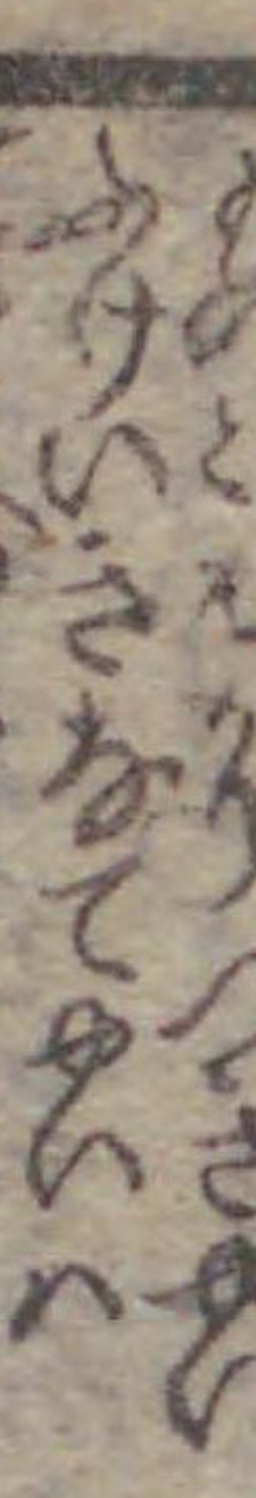ふけいきなてやいは
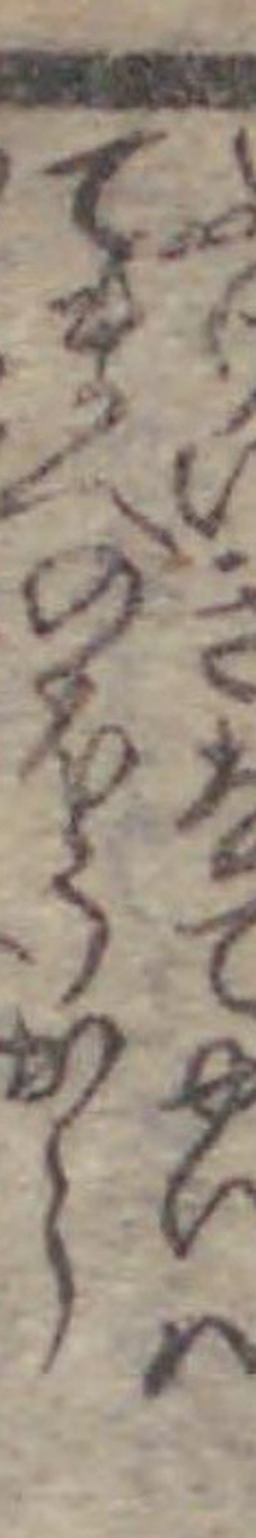てまへのほうから
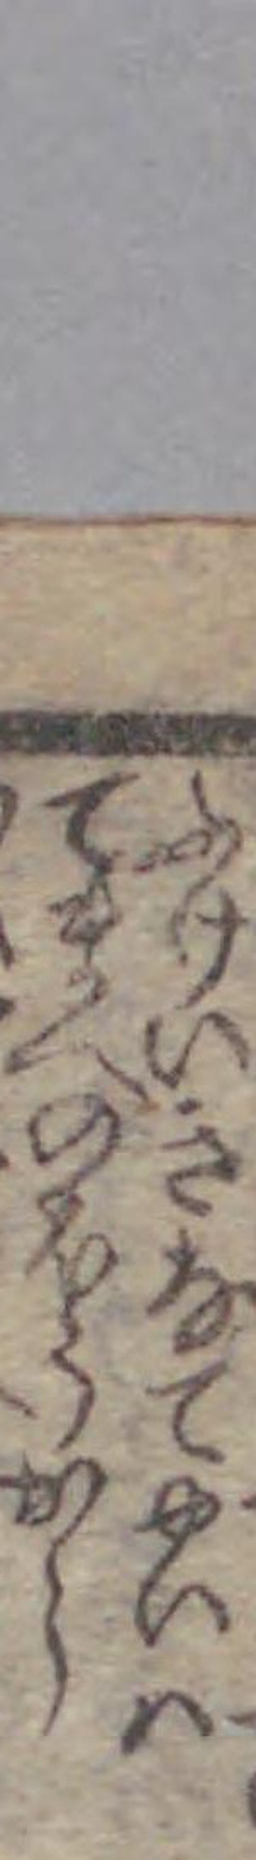てまへのほうから
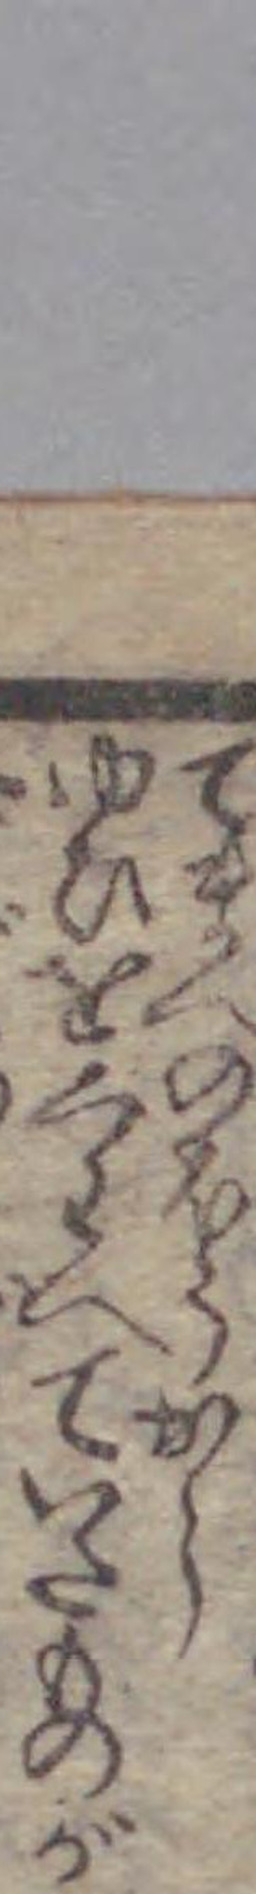ゆひをくわへていたものが
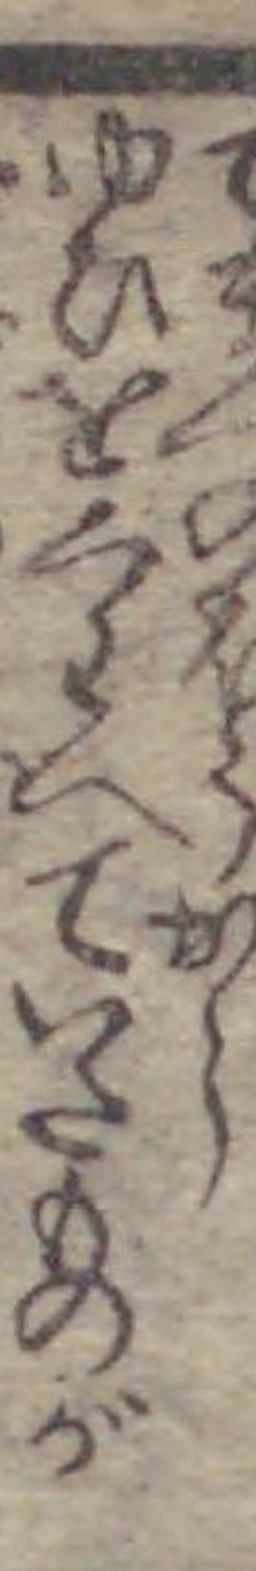ゆひをくわへていたものが
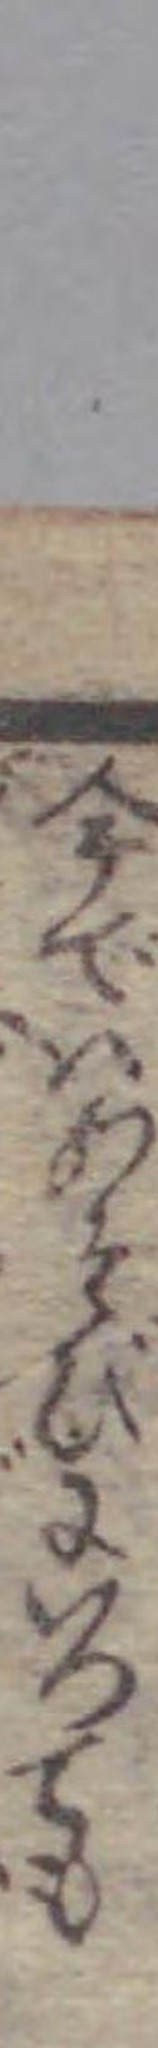今ではあそびにいつても
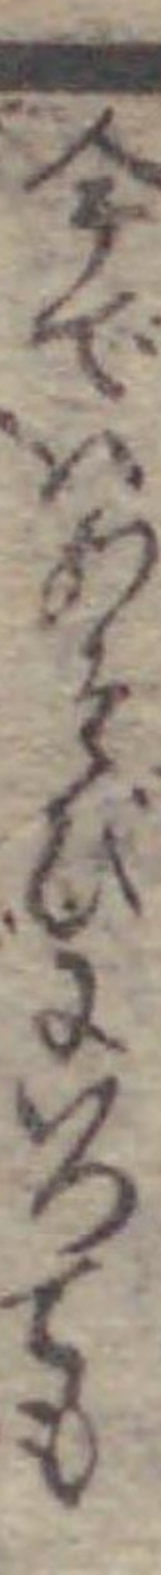今ではあそびにいつても
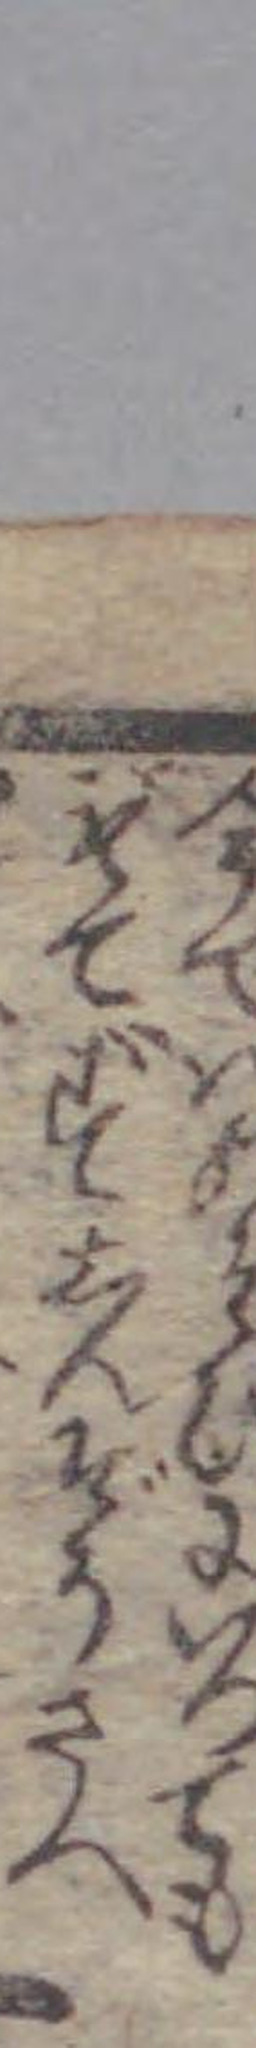もてずしんぞうさへ
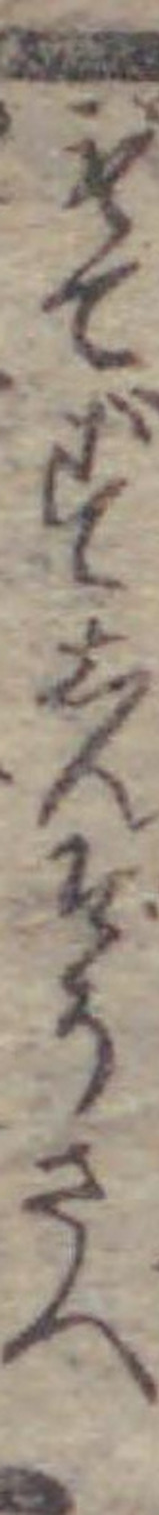もてずしんぞうさへ
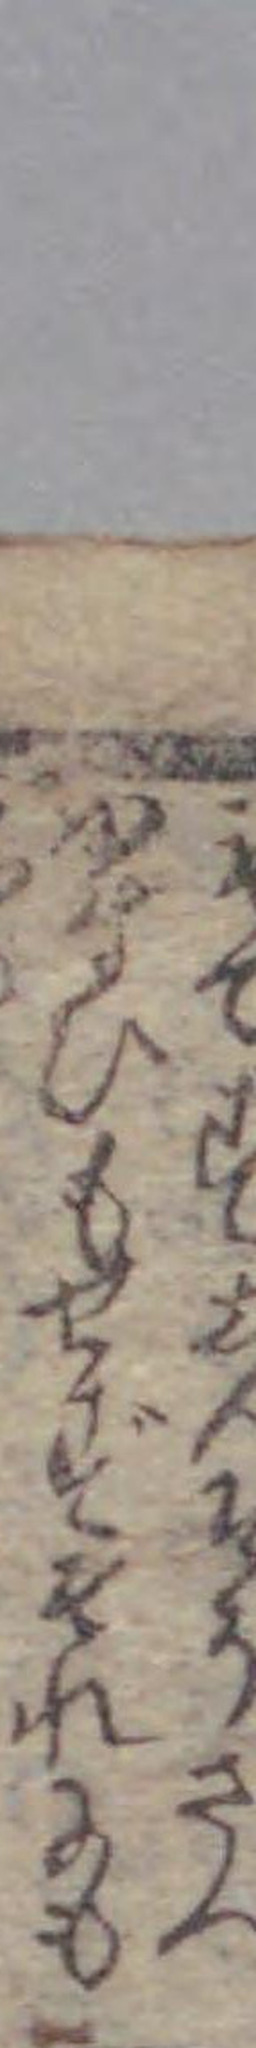ゆすひもせずそれにも
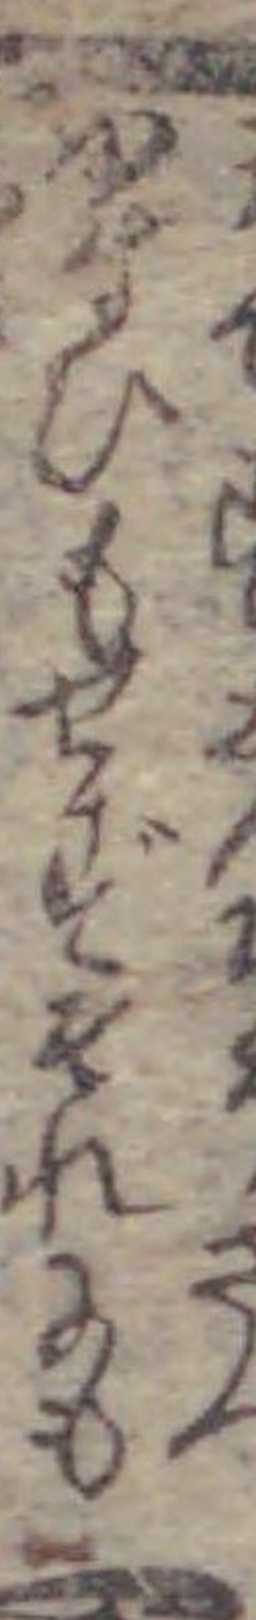ゆすひもせずそれにも
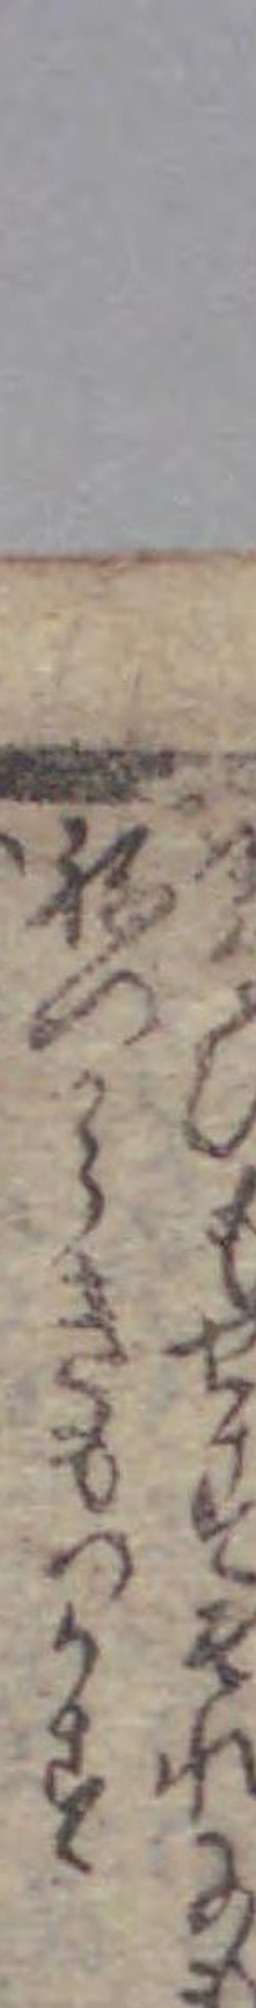ねつからきもつかす
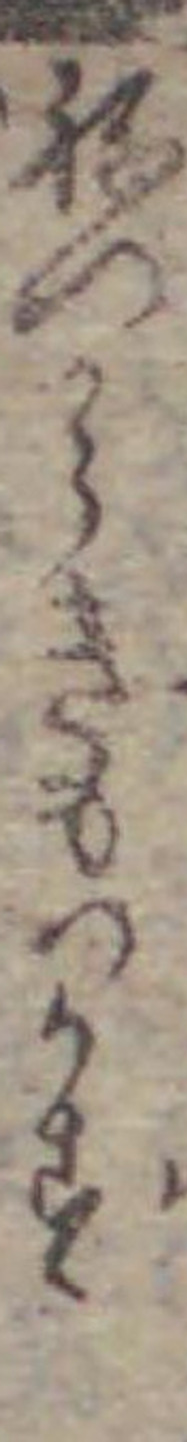ねつからきもつかす
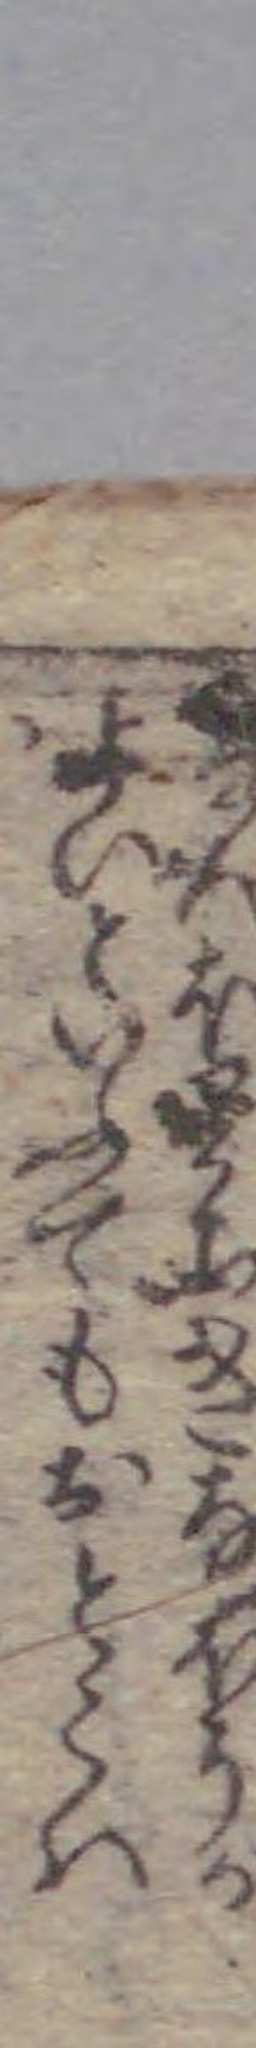よいといふてもおとこは
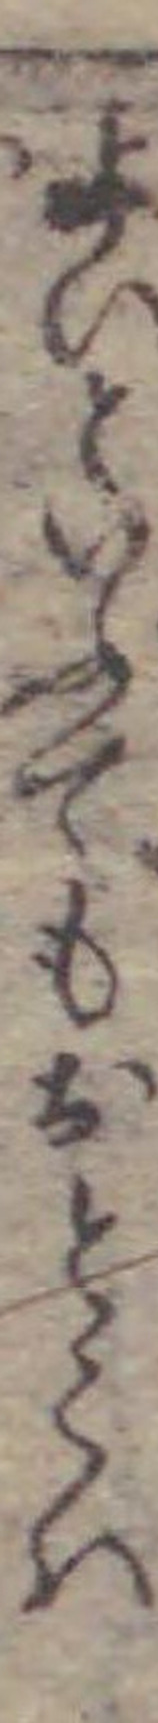よいといふてもおとこは
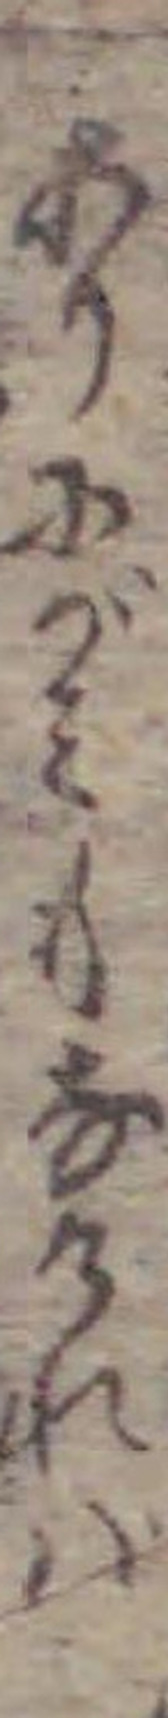ありにがみもなければ
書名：談芭菰誉詞 : 3巻
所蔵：国立国会図書館 National Diet Library, JAPAN
